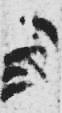命
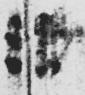出
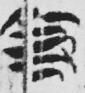命
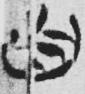自
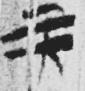天
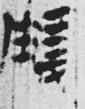降
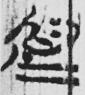道
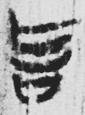○（始）
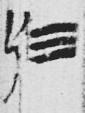於
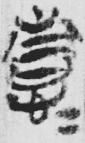情情
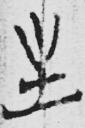生
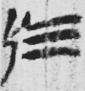於
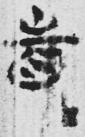眚（性）
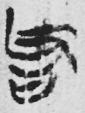○（始）
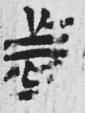者
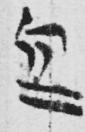近
